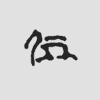凥
